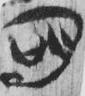名（銘）
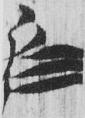於
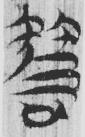○（席）
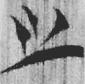之
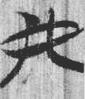四
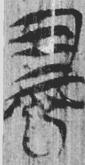耑（端）
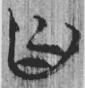曰
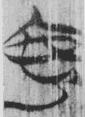安
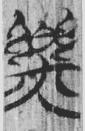樂
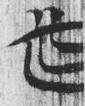必
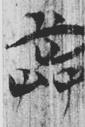戒
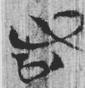右
